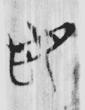母
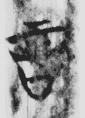言
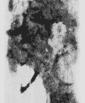而
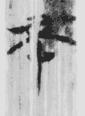不
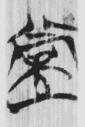當
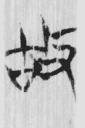故
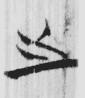之
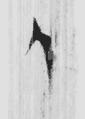人
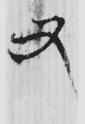又
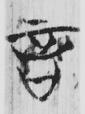言
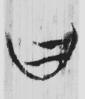曰
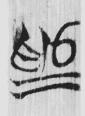爲
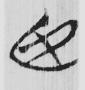臣
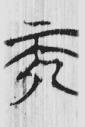而
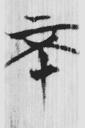不
